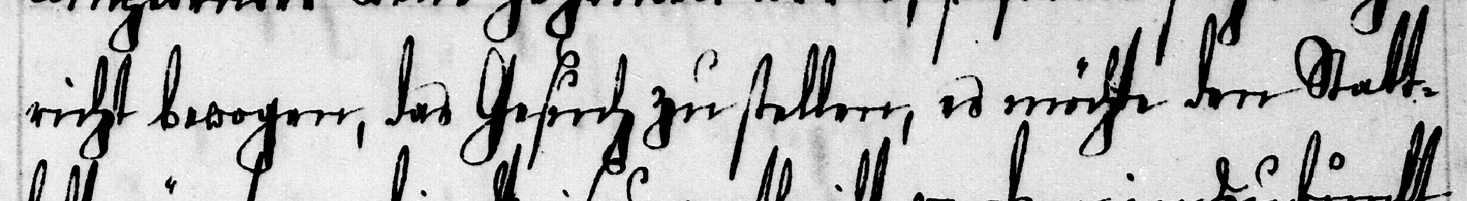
richt bewogen, das Gesuch zu stellen, es möchte den Statt¬
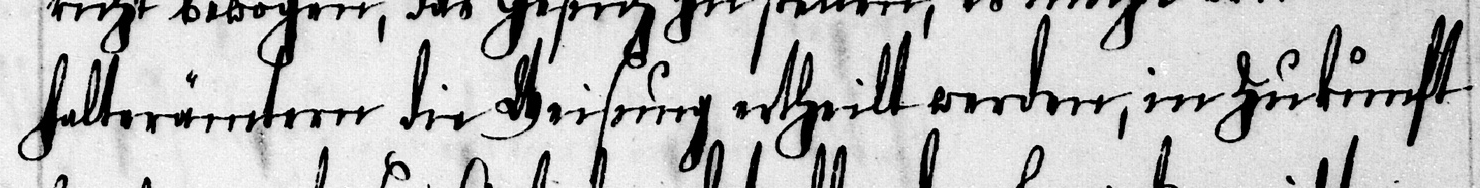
halterämtern die Weisung ertheilt werden, in Zukunft
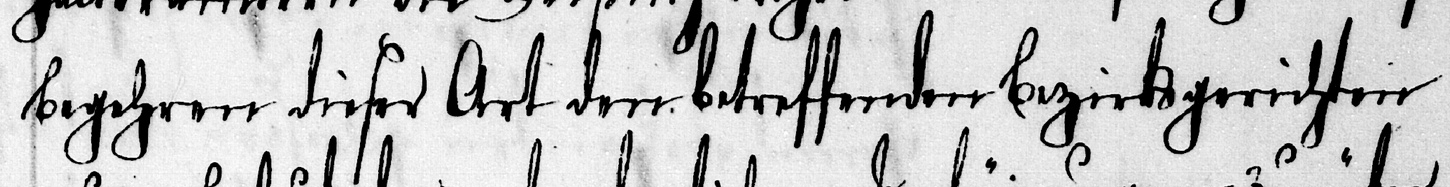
Begehren dieser Art den betreffenden Bezirksgerichten
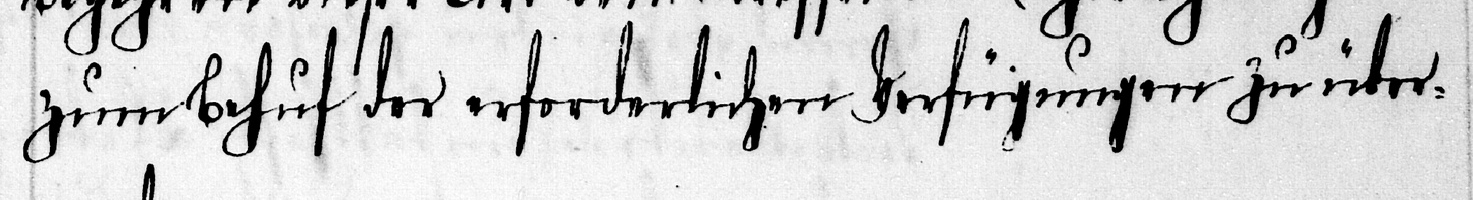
zum Behuf der erforderlichen Verfügungen zu über¬
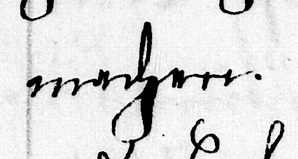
machen.
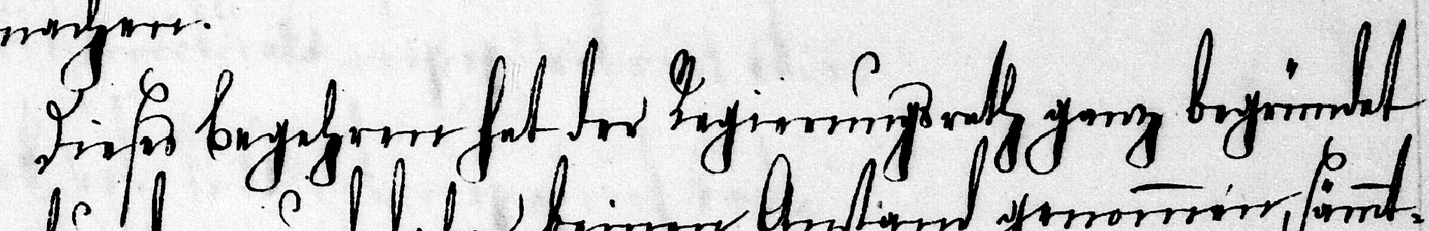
Dieses Begehren hat der Regierungsrath ganz begründet
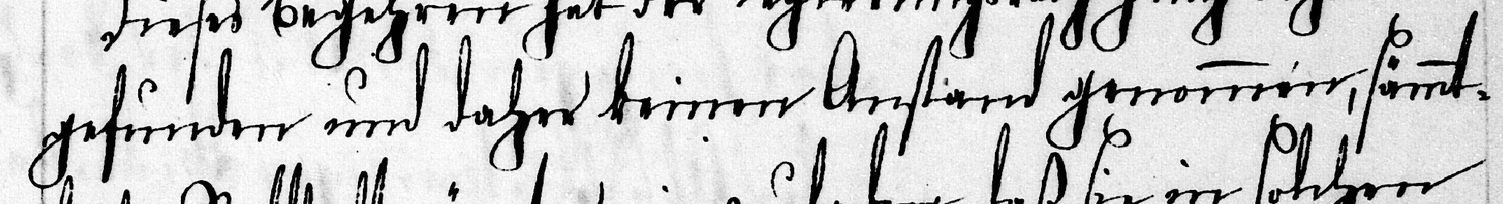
gefunden und daher keinen Anstand genommen, sämmt¬
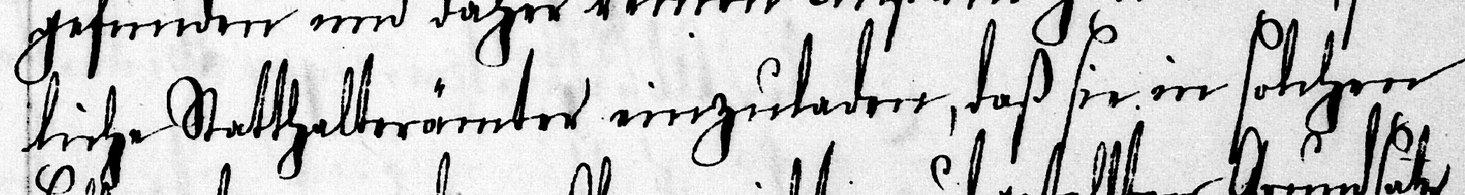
liche Statthalterämter einzuladen, daß sie in solchen
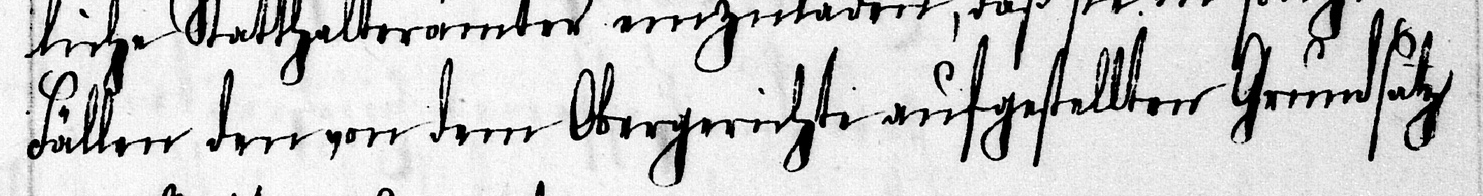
Fällen den von dem Obergerichte aufgestellten Grundsatz
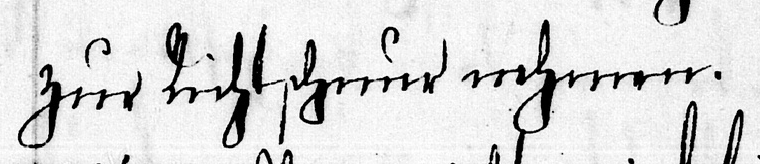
zur Richtschnur nehmen.
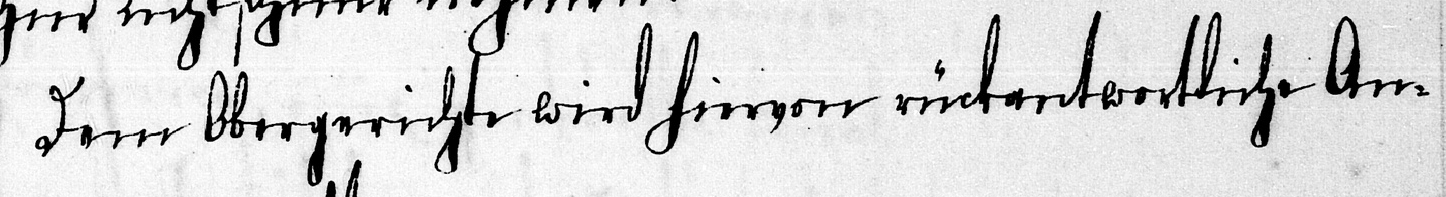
Dem Obergerichte wird hiervon rückantwortliche An¬
